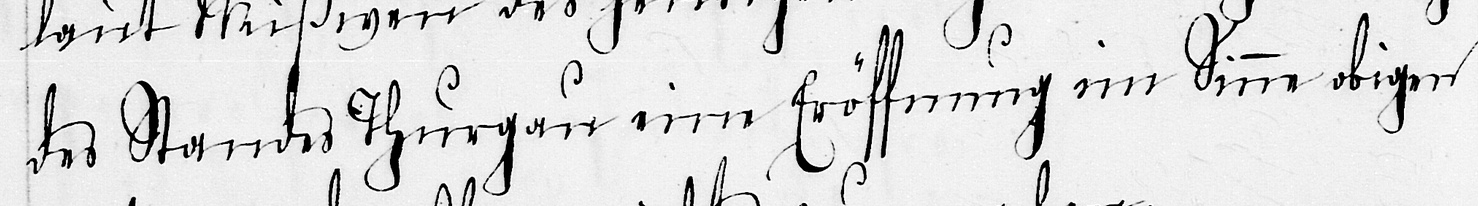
des Standes Thurgau eine Eröffnung im Sinne obigen
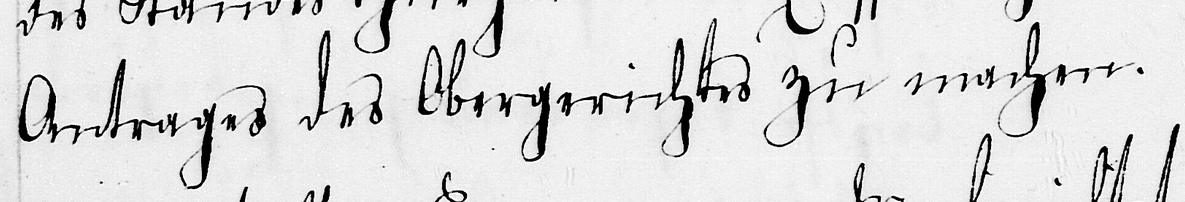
Antrages des Obergerichtes zu machen.
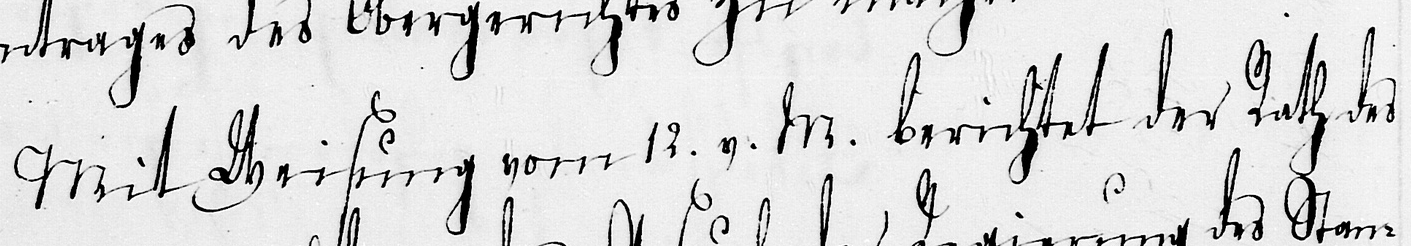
Mit Weisung vom 12. v. M. berichtet der Rath des
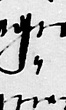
ds,
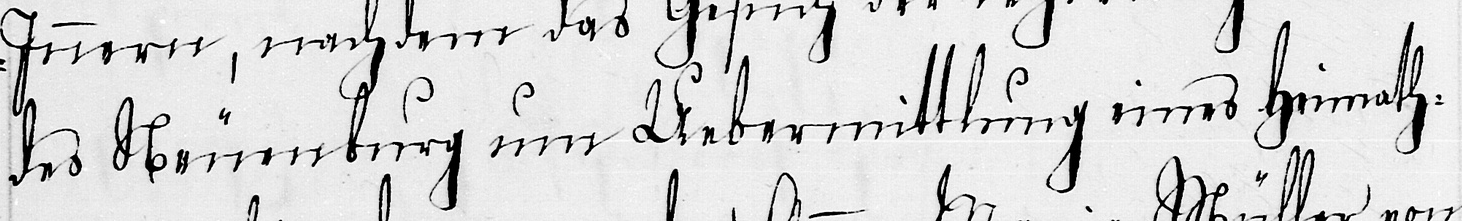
ndes Neuenburg um Uebermittlung eines Heimath¬
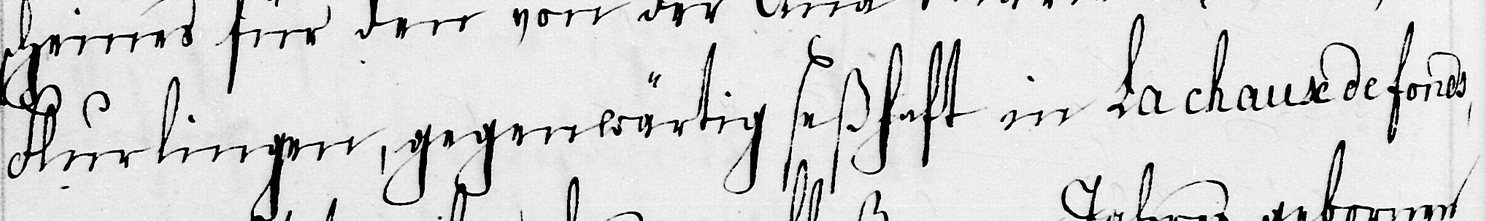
Flurlingen, gegenwärtig seßhaft in La chaux de fon¬
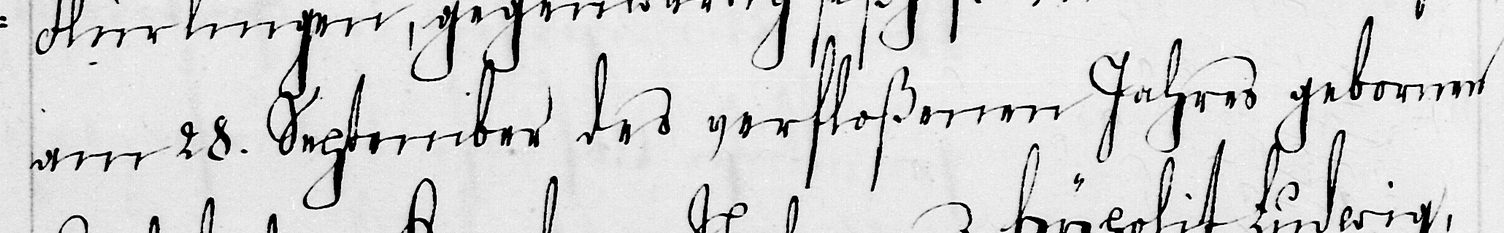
am 28. September des verfloßenen Jahres gebornen
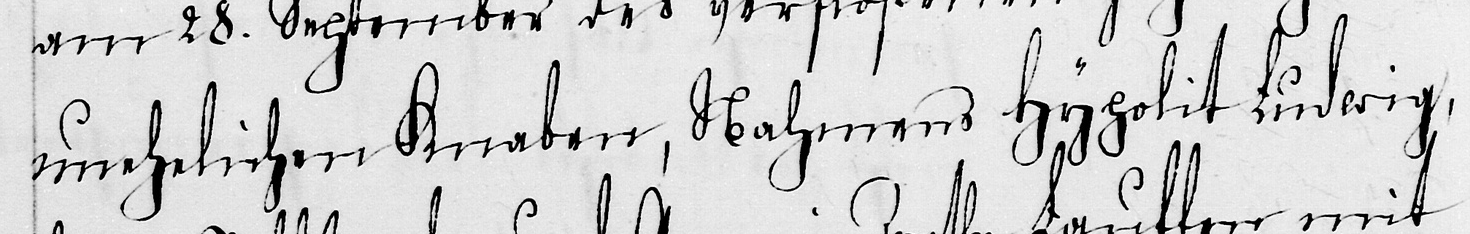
unehelichen Knaben, Nahmens Hypolit Ludwig,
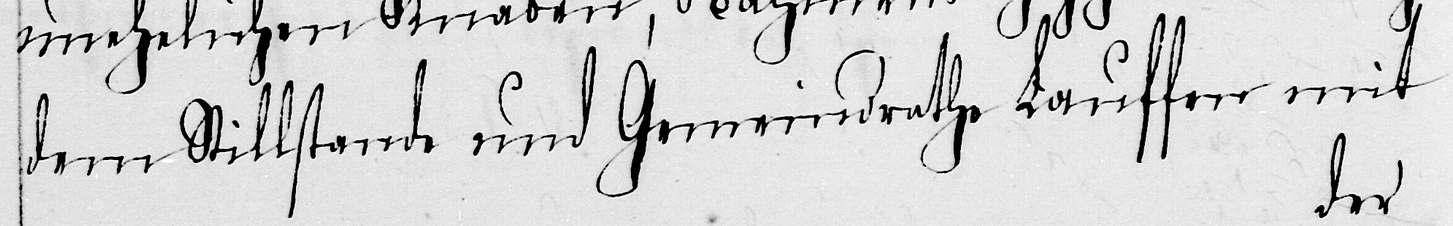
dem Stillstande und Gemeindrathe Lauffen mit
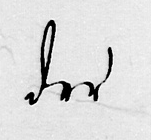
der
